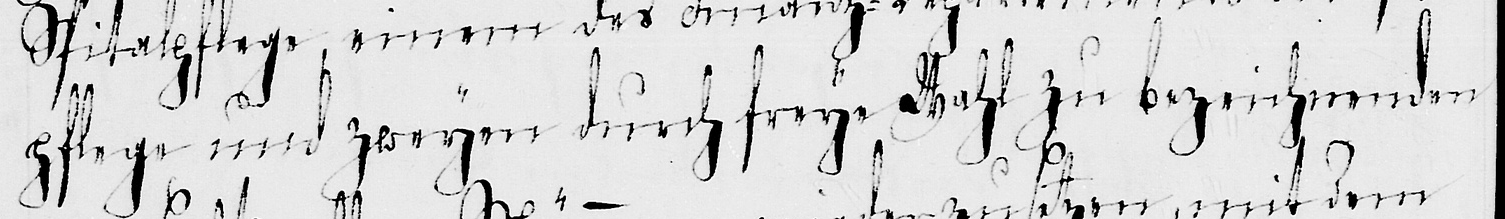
pflege und zweyen durch freye Wahl zu bezeichnenden
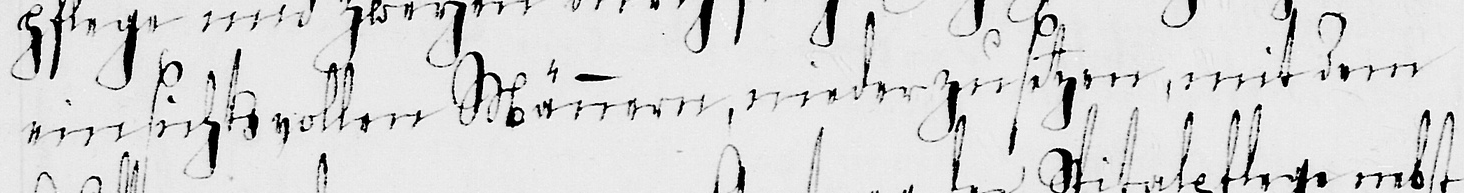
einsichtsvollen Männern, niederzusetzen, mit dem
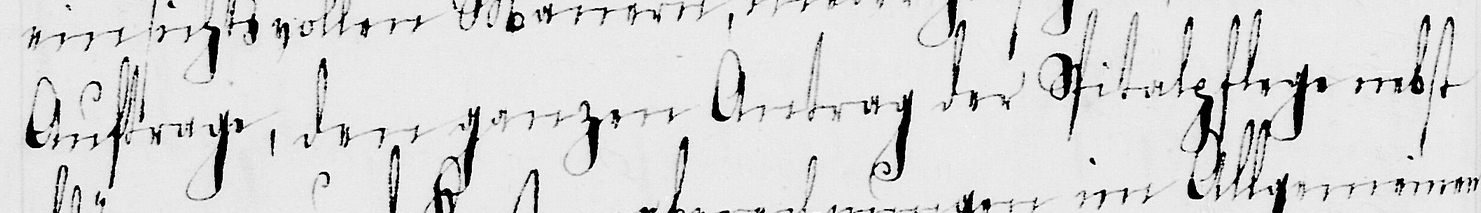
Auftrage, den ganzen Antrag der Spitalpflege nebst
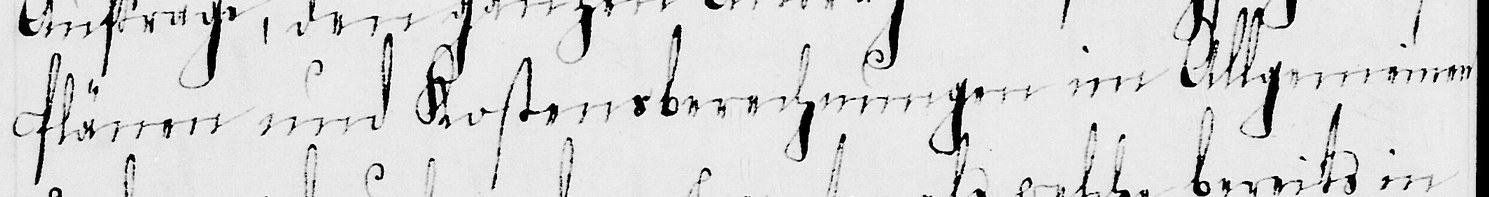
Plänen und Kostensberechnungen im Allgemeinen
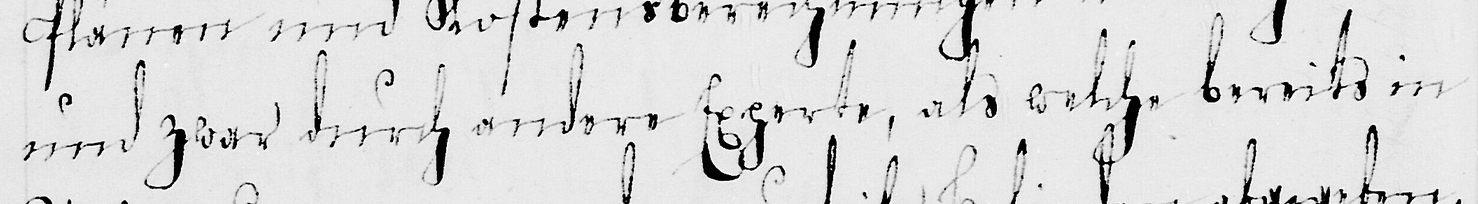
und zwar durch andere Experte, als welche bereits in
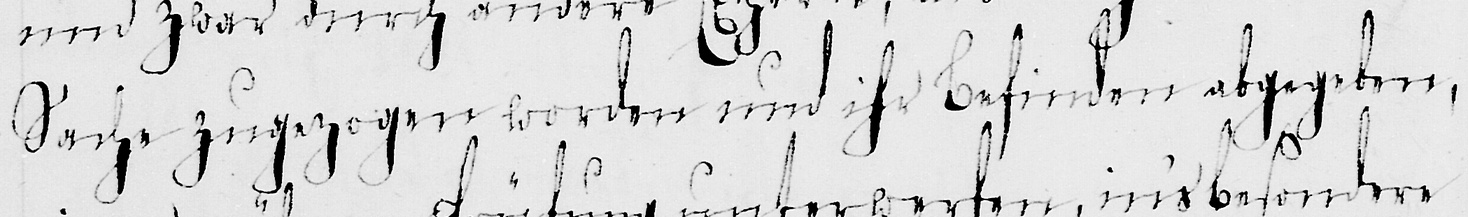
Sache zugezogen worden und ihr Befinden abgegeben,
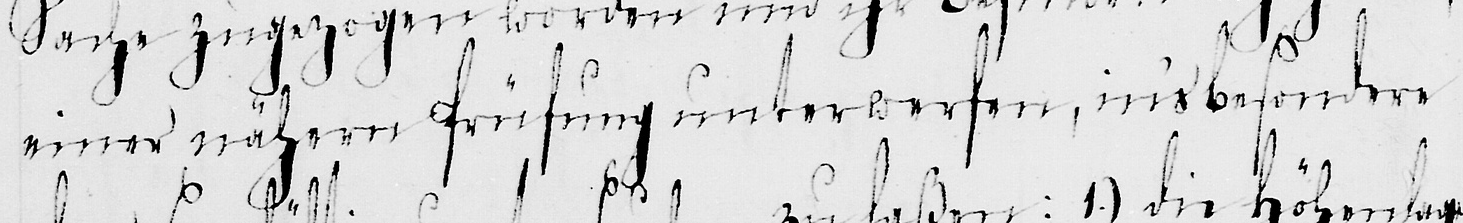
einer nähern Prüfung unterwerfen, insbesondere
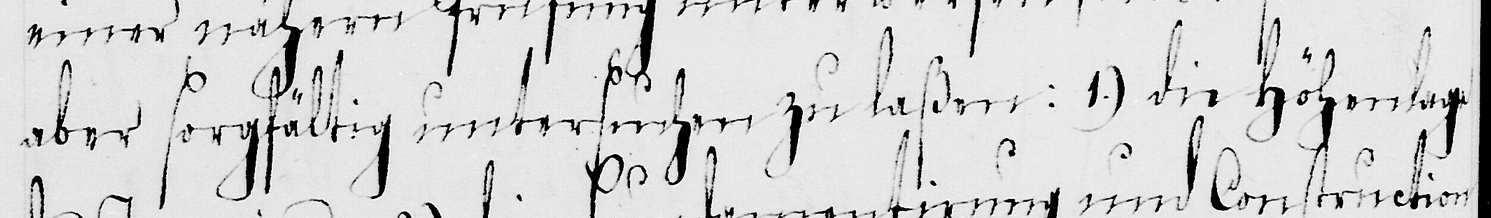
aber sorgfältig untersuchen zu laßen: 1.) die Höhenlage
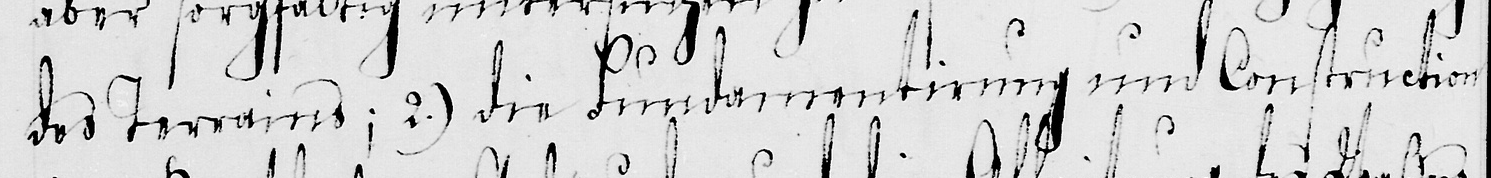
des Terrains; 2.) die Fundamentirung und Construction
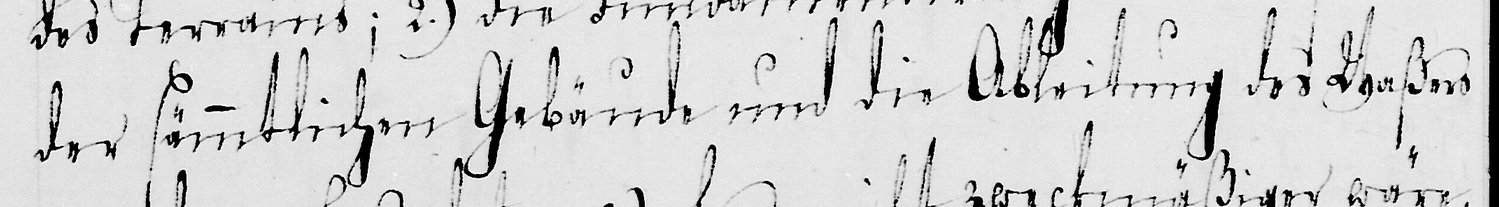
der sämmtlichen Gebäude und die Ableitung des Waßers
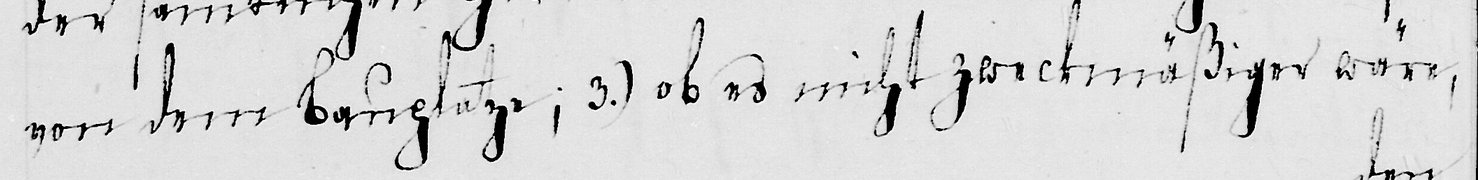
von dem Bauplatze; 3.) ob es nicht zweckmäßiger wäre,
